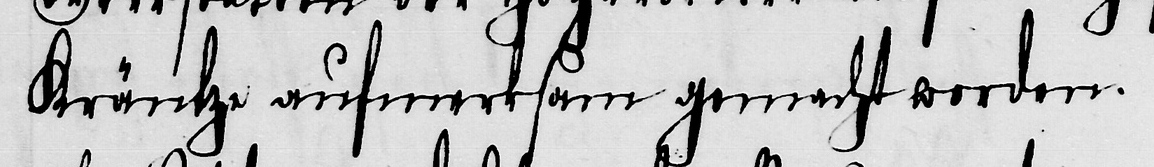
Kräntze aufmerksam gemacht worden.
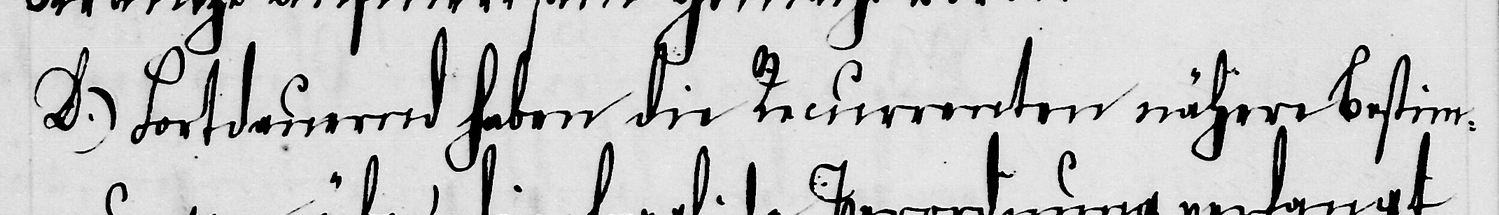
D.) Fortdauernd haben die Recurrenten nähere Bestim¬
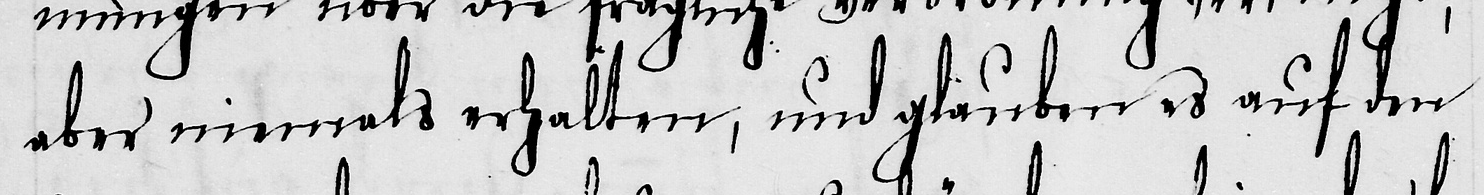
aber niemals erhalten, und glauben es auf den
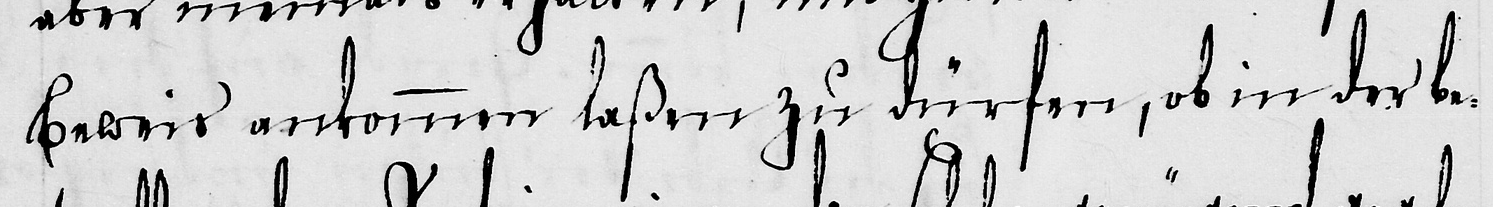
Beweis ankommen laßen zu dürfen, ob in der be¬
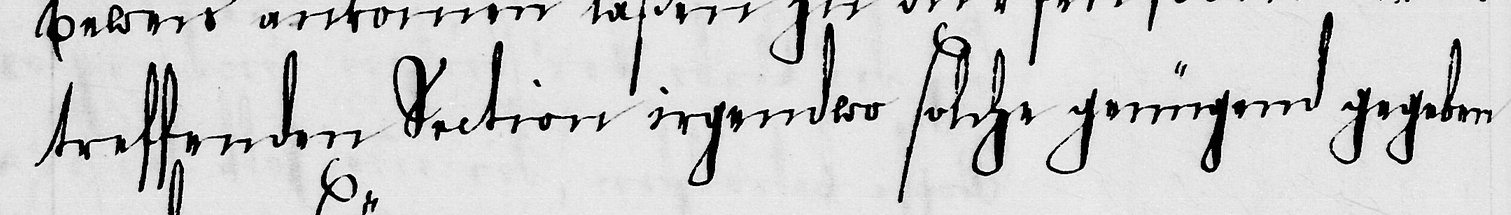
treffenden Section irgendwo solche genügend gegeben
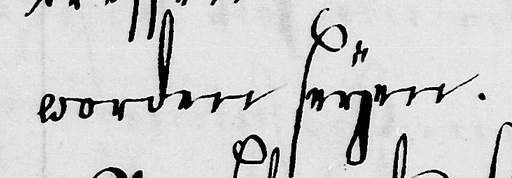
worden seyen.
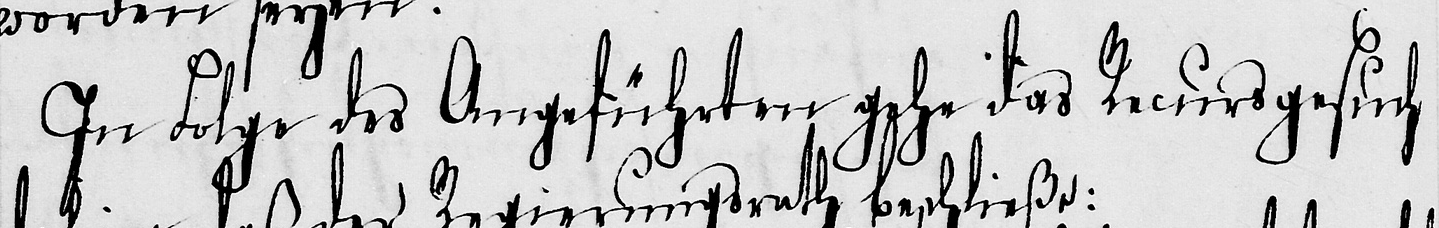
In Folge des Angeführten gehe das Recursgesuch
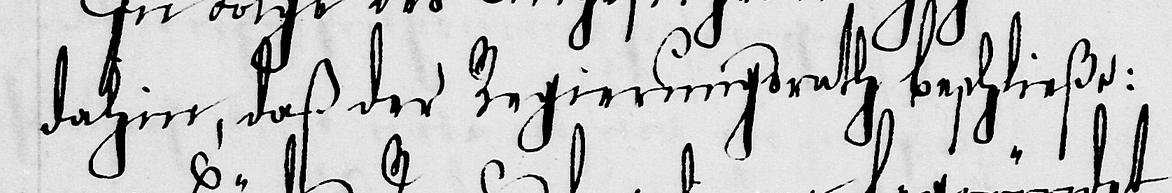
dahin, daß der Regierungsrath beschließe:
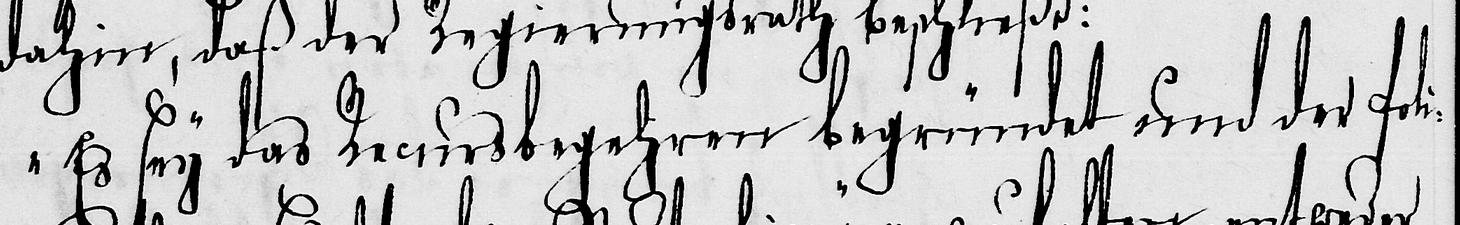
„Es sey das Recursbegehren begründet und der Po¬
